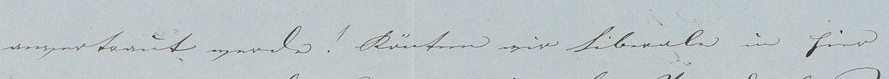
anvertraut werde! Könten wir Liberale in hier
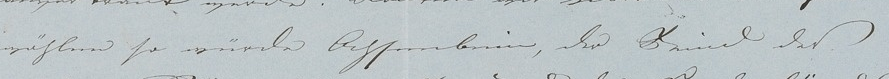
wählen so würde Ochsenbein, der Feind des
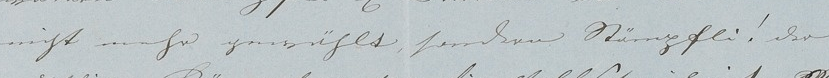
nicht mehr gewählt, sondern Stämpfli! der
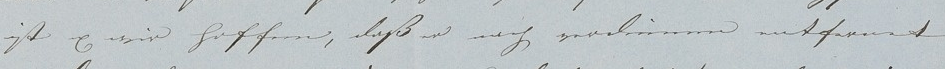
ist & wir hoffen, daß er nach verdienen entfernet
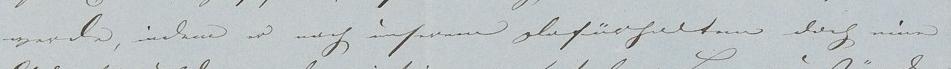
werde, indem er nach unserem Dafürhalten doch eine
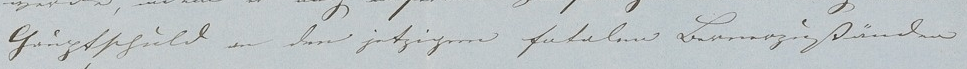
Hauptschuld an den jetzigen fatalen Bernerzuständen
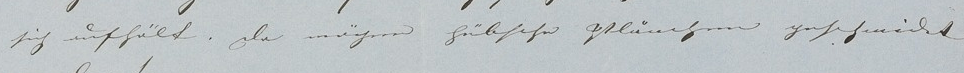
sich aufhält. Da mögen hübsche Plänchen geschmidet
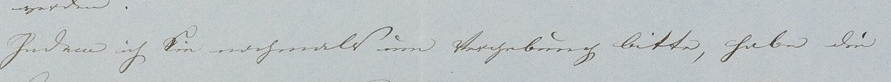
Indem ich Sie nochmals um Vergebung bitte, habe die
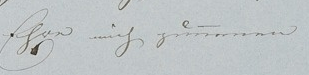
Ehre mich zunnenen
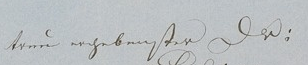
treu ergebenster Dr:
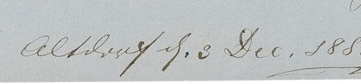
Altdorf den 3 Dec. 1851.
